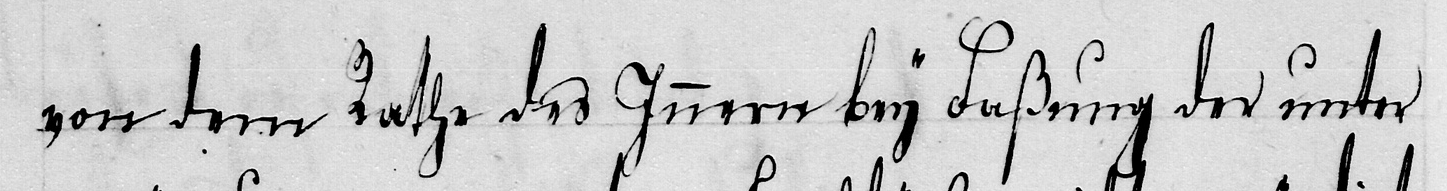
vom dem Rathe des Innern bey Faßung der unter
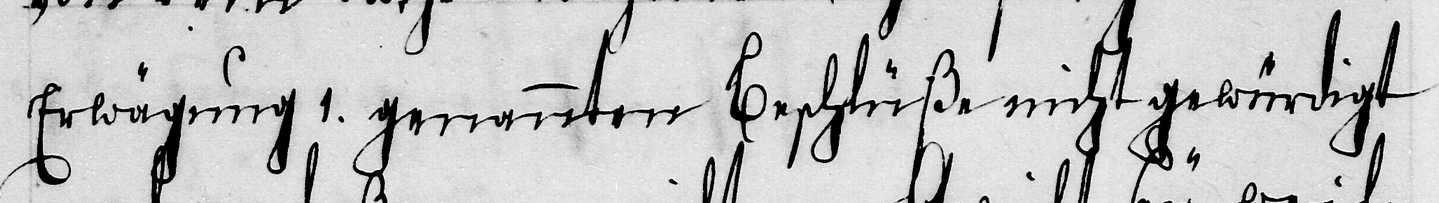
Erwägung 1. genannten Beschlüße nicht gewürdigt
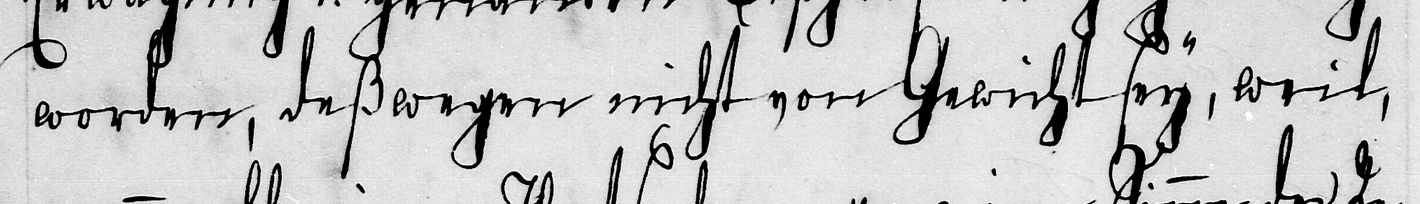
worden, deßwegen nicht von Gewicht sey, weil,
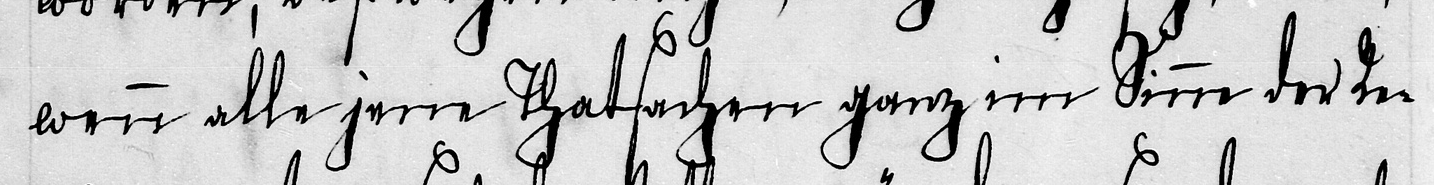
wenn alle jene Thatsachen ganz im Sinne der Re¬
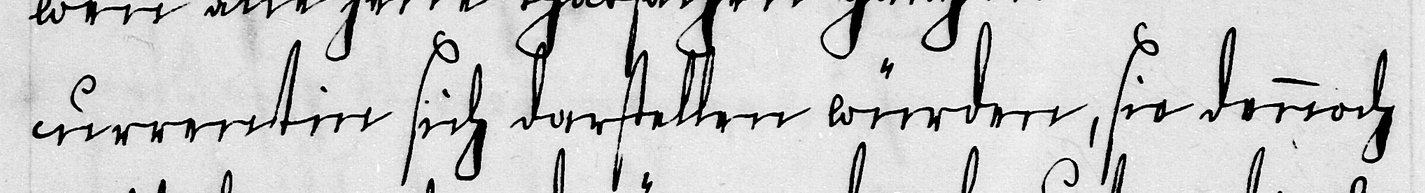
currentin sich darstellen würden, sie dennoch
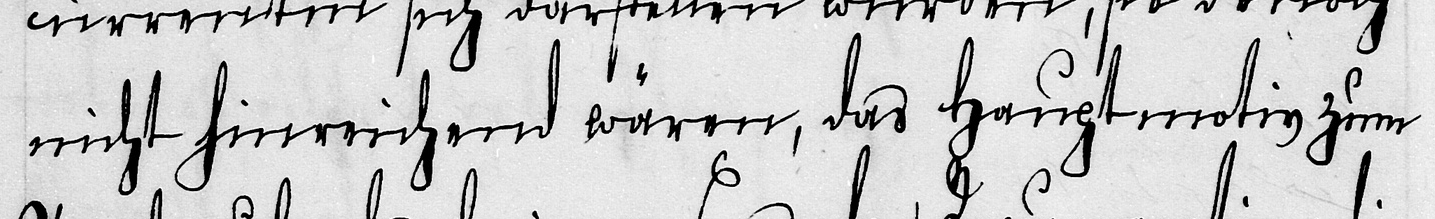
nicht hinreichend wären, das Hauptmotiv zum
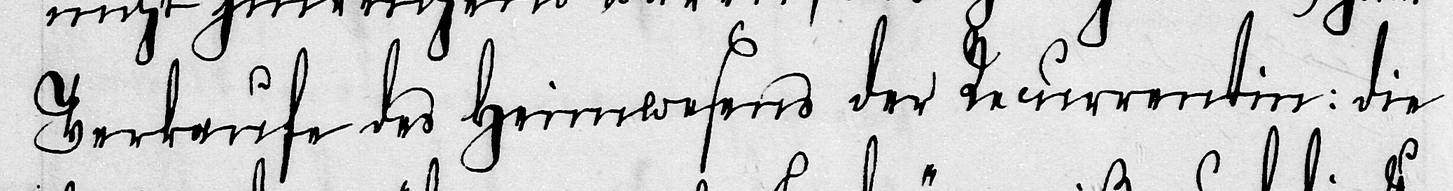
Verkaufe des Heimwesens der Recurrentin: die
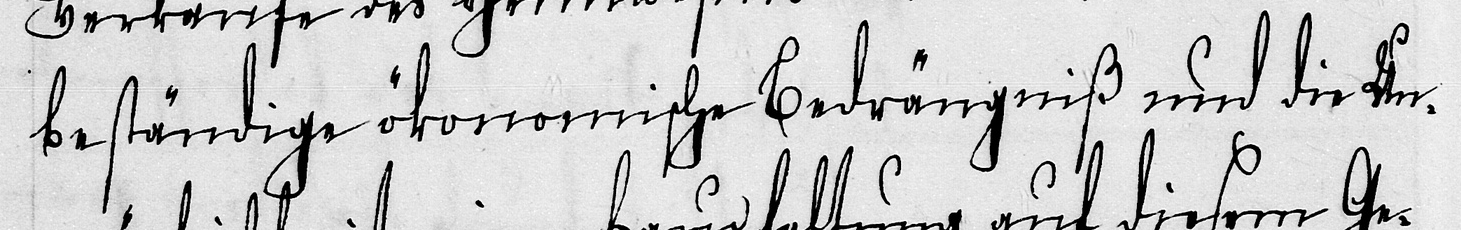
beständige ökonomische Bedrängniß und die Un¬
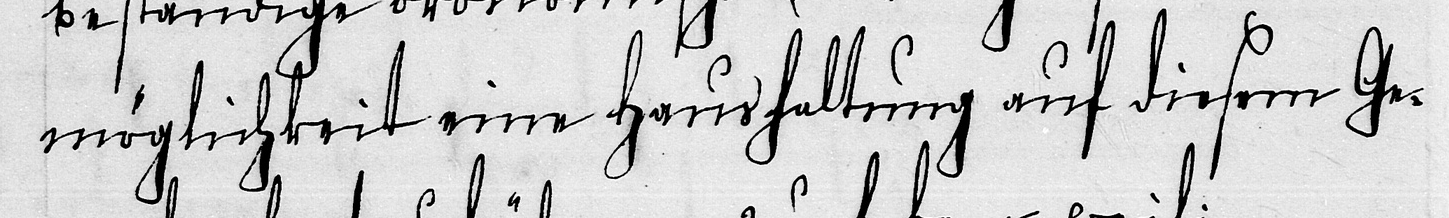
möglichkeit eine Haushaltung auf diesem Ge¬
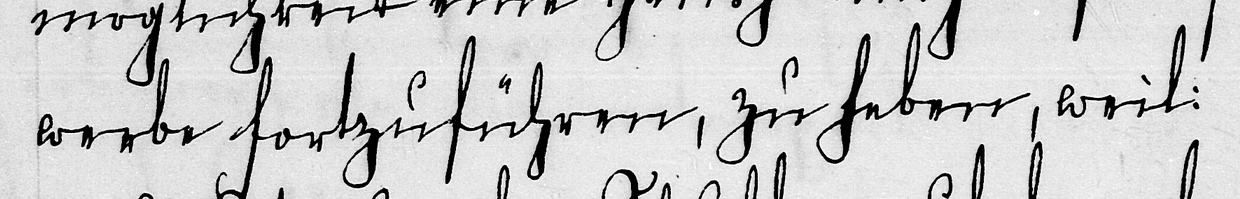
werbe fortzuführen, zu heben, weil:
